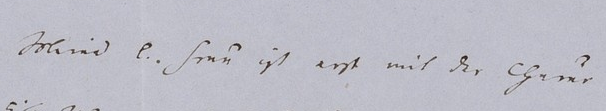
Meine l. Frau ist erst mit der Churer
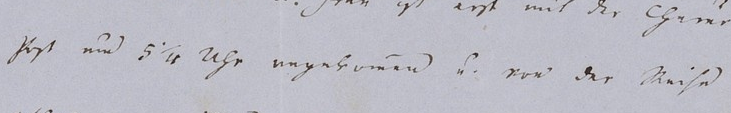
Post um 5¼ Uhr angekommen u. von der Reise
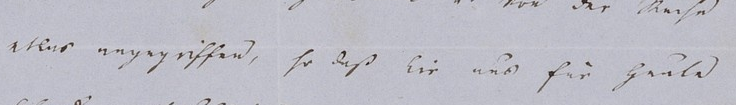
etwas angegriffen, so daß wir uns für heute
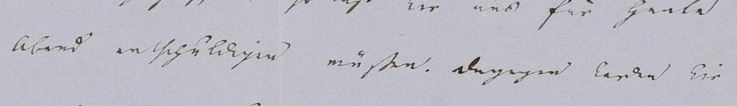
Abend entschuldigen müssen. Dagegen werden wir
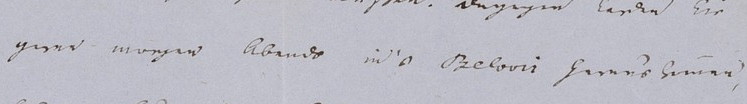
gerne morgen Abends in's Belvoir herauskommen,
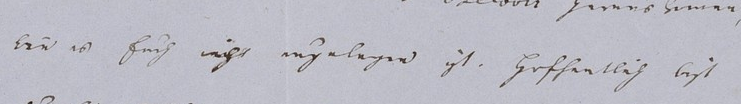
wenn es Euch nicht ungelegen ist. Hoffentlich bist
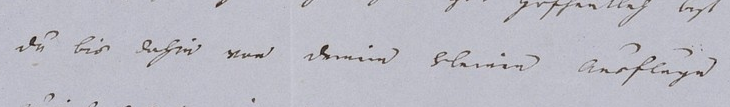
Du bis dahin von Deinem kleinen Ausfluge
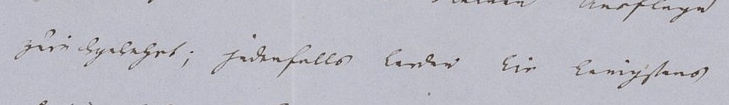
zurückgekehrt; jedenfalls werden wir wenigstens
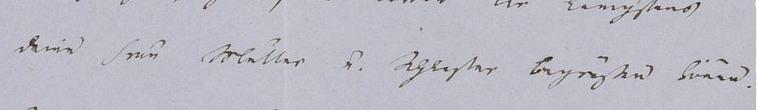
Deine Frau Mutter u. Schwester begrüßen können.
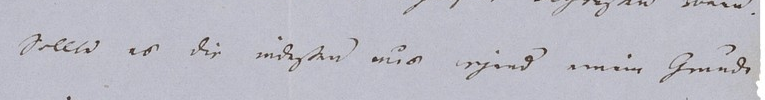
Sollte es Dir indessen aus irgend einem Grunde
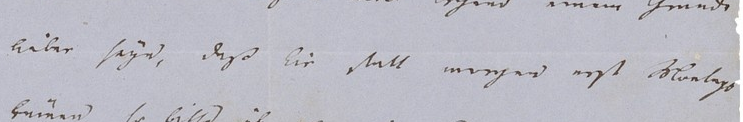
lieber seyn, daß wir statt morgen erst Montags
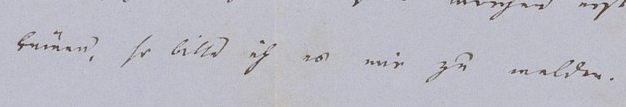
kämen, so bitte ich es mir zu melden.
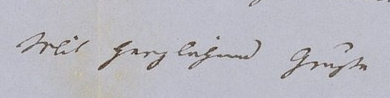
Mit herzlichem Gruße
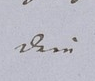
Dein
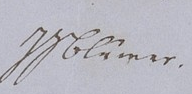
J Blumer.
